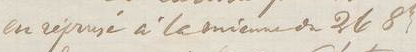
en réponse à la mienne du 26 8bre.
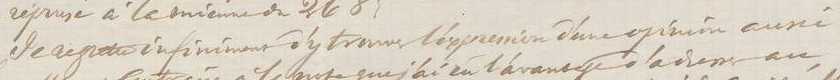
Je regrette infiniment d'y trouver l'expression d'une opinion aussi
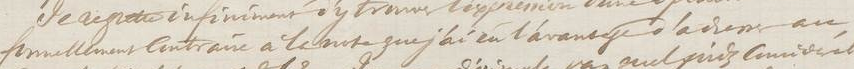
formellement contraire à la note que j'ai eû l'avantage d'adresser au
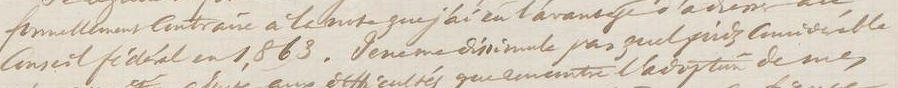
Conseil fédéral en 1863. Je ne me dissimule pas quel prix considérable
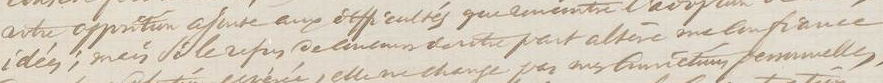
idées; mais si le refus de concours de votre part altère ma confiance
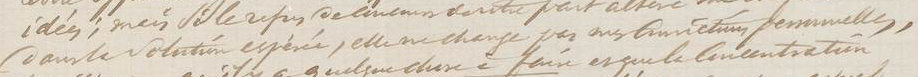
dans la solution espérée, elle ne change pas mes convictions personnelles,
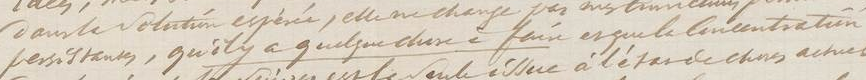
persistantes, quil y a quelque chose à faire et que la concentration
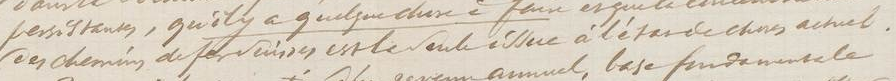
des chemins de fer suisses est le seule issue à l'état de choses actuel.
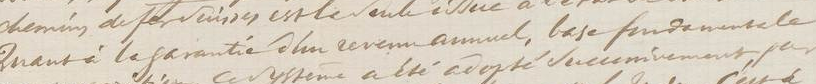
Quant à la garantie d'un revenu annuel, base fondamentale
